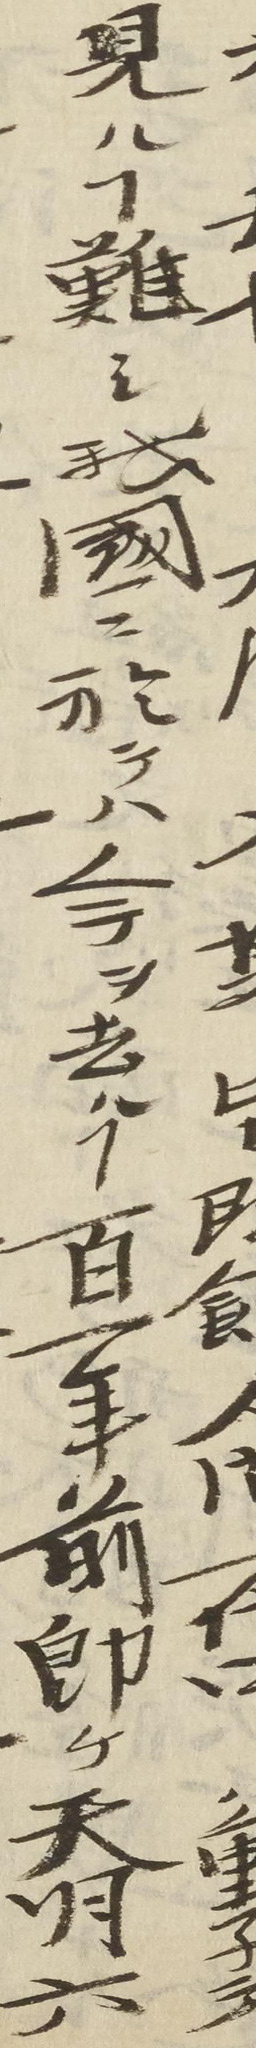見ルコト難シ我国ニ於テハ今ヲ去ルコト百一年前即チ天明六
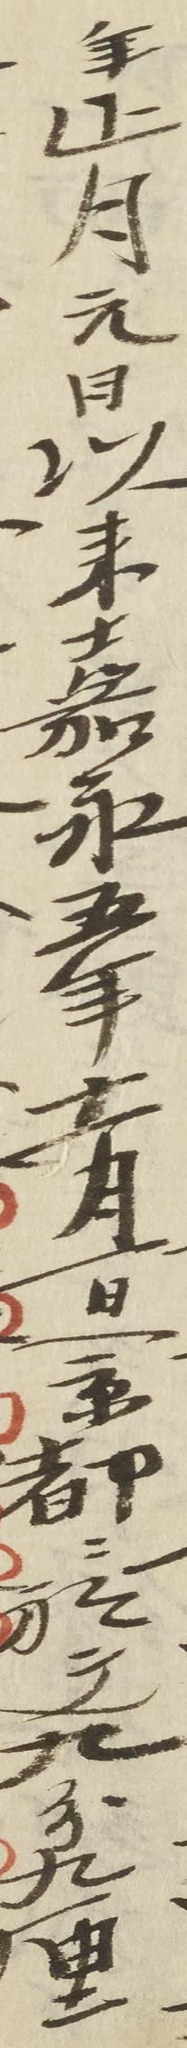年正月元日以来嘉永五年十一月一日九分九厘
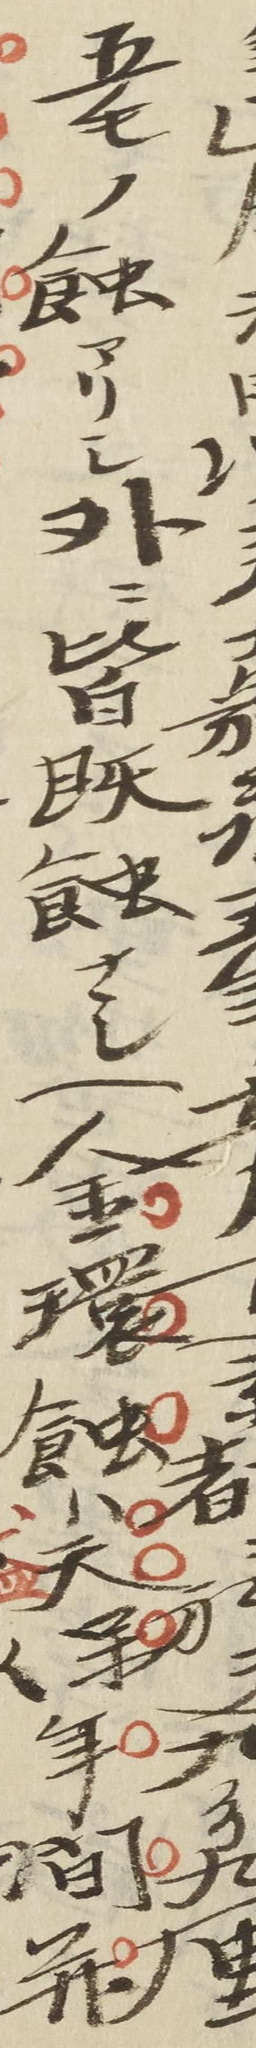五毛ノ蝕アリシ外ニ皆既ナシ（金環蝕ハ天保年間并
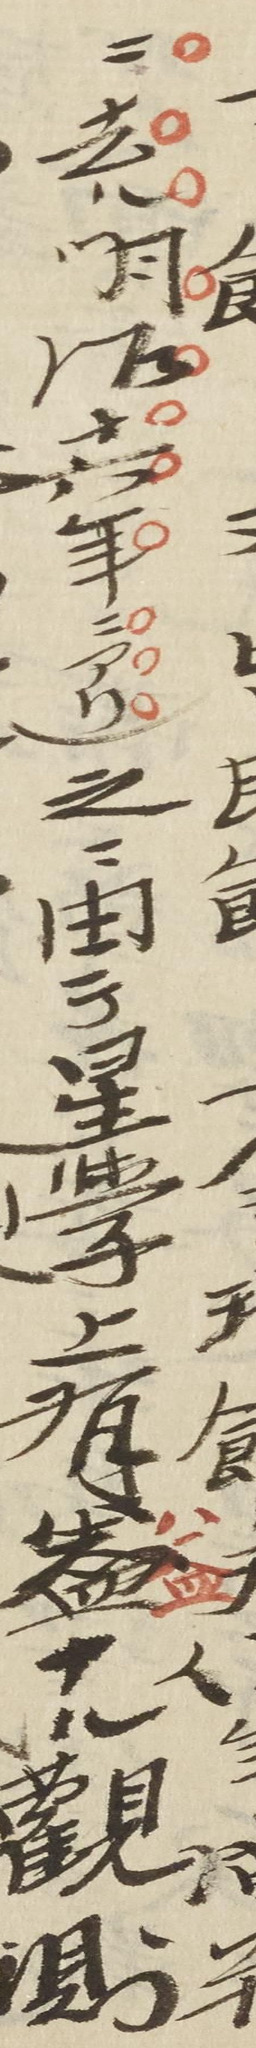ニ去ル明治十六年ニアリ）之ニ由テ星学上有益ナル観測
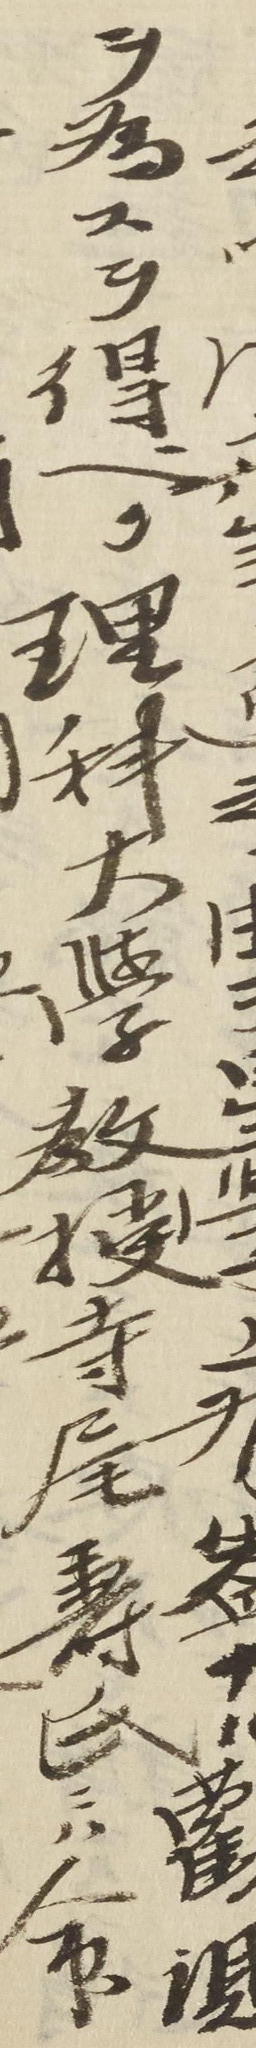ヲ為スヲ得ベク理科大学教授寺尾寿氏ニハ命
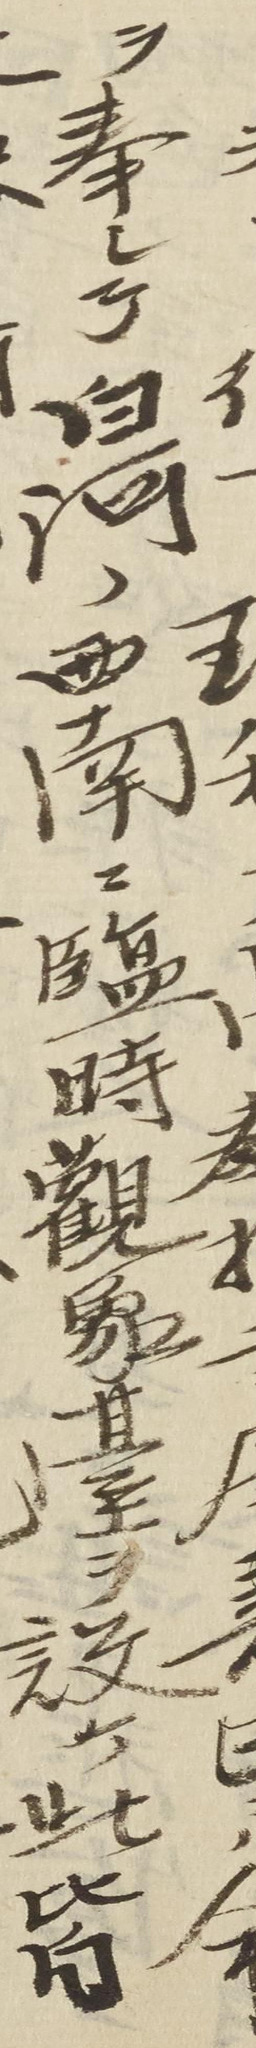ヲ奉シテ白河ノ西南ニ臨時観象台ヲ設ヶ此皆
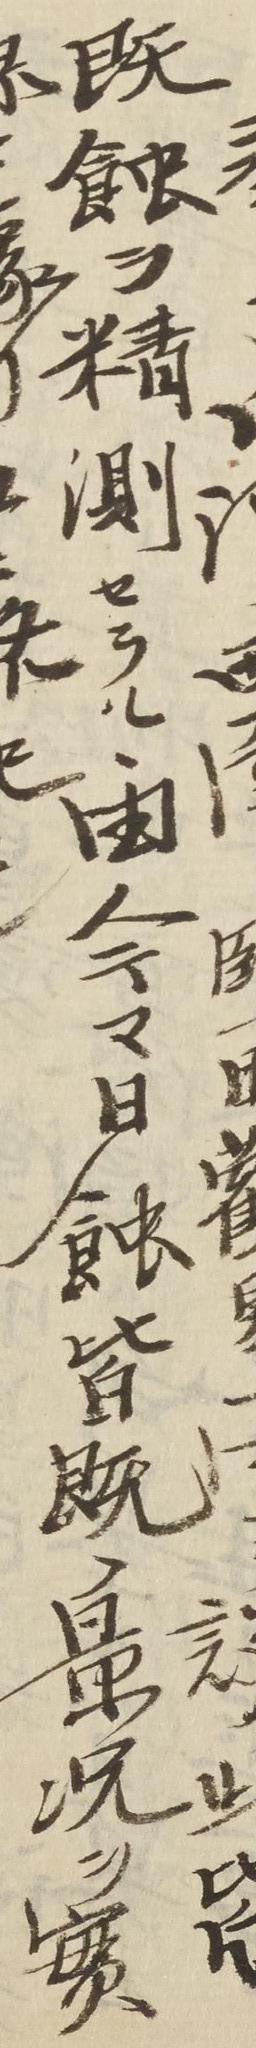既日蝕ヲ精測セラルゝ由今マ日蝕皆既ノ景況ヲ実
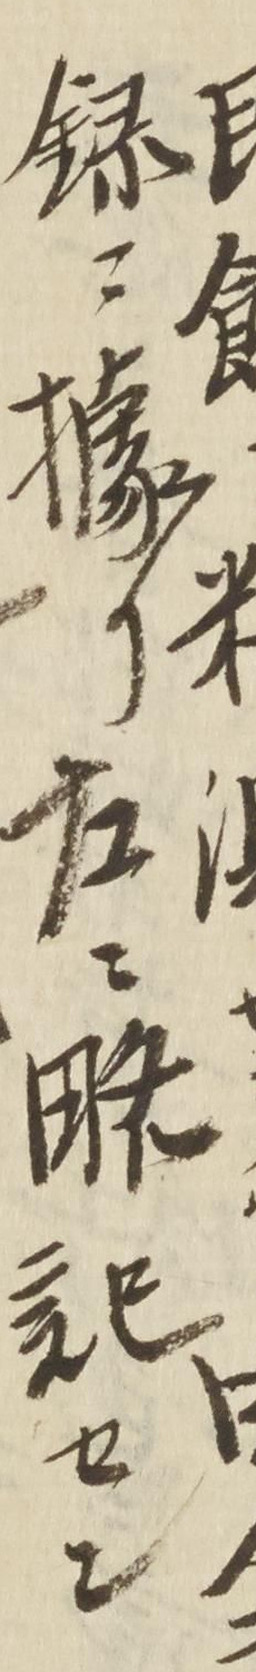録ニ拠リ左ニ略記セシ
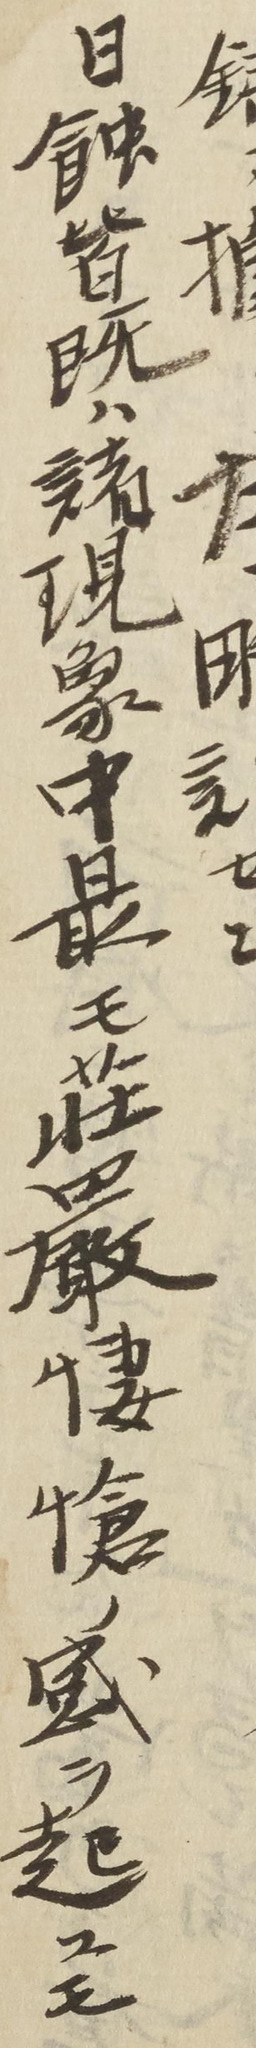日蝕皆既ハ諸現象中最モ荘厳凄愴ノ感ヲ起スモ

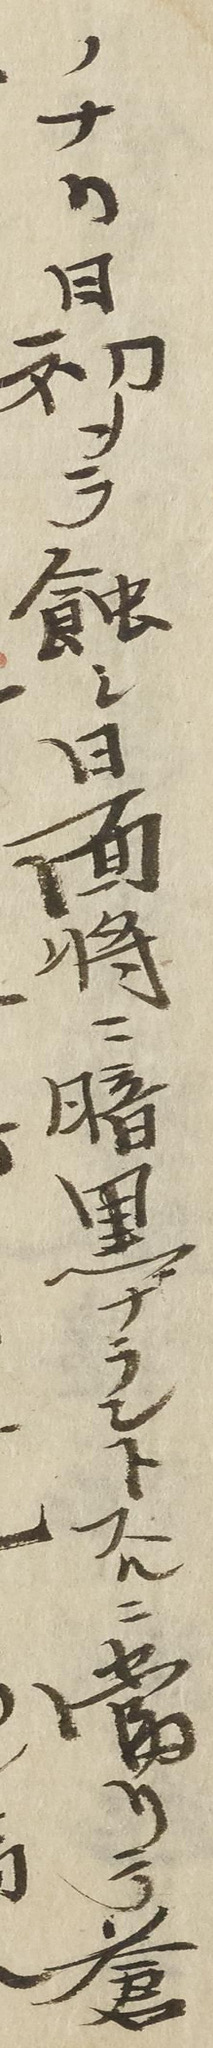ノナリ日初メテ蝕シ日面将ニ暗黒ナラントスルニ当リテ蒼
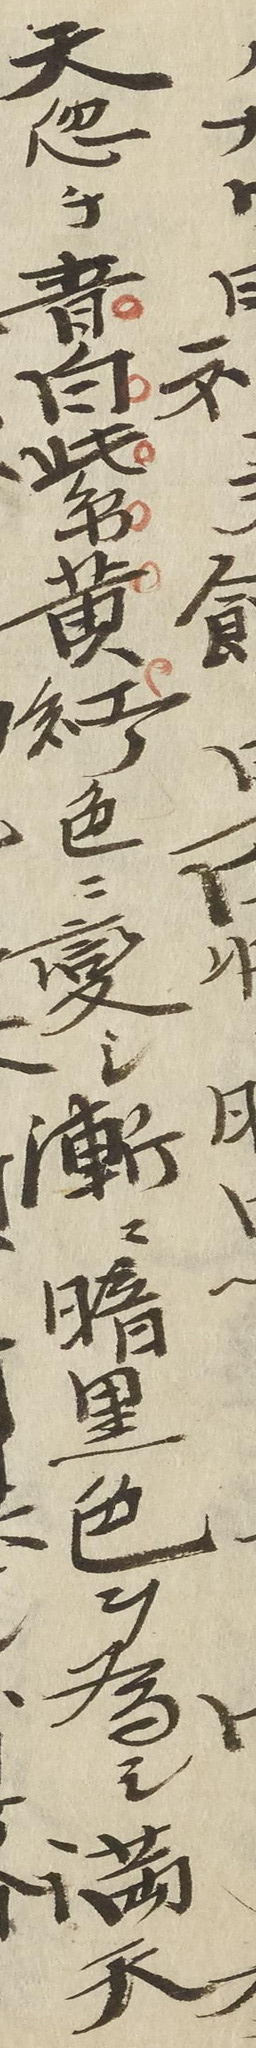天忽チ青白紫黄紅ノ色に変シ漸ニ暗黒色ヲ為シ満天
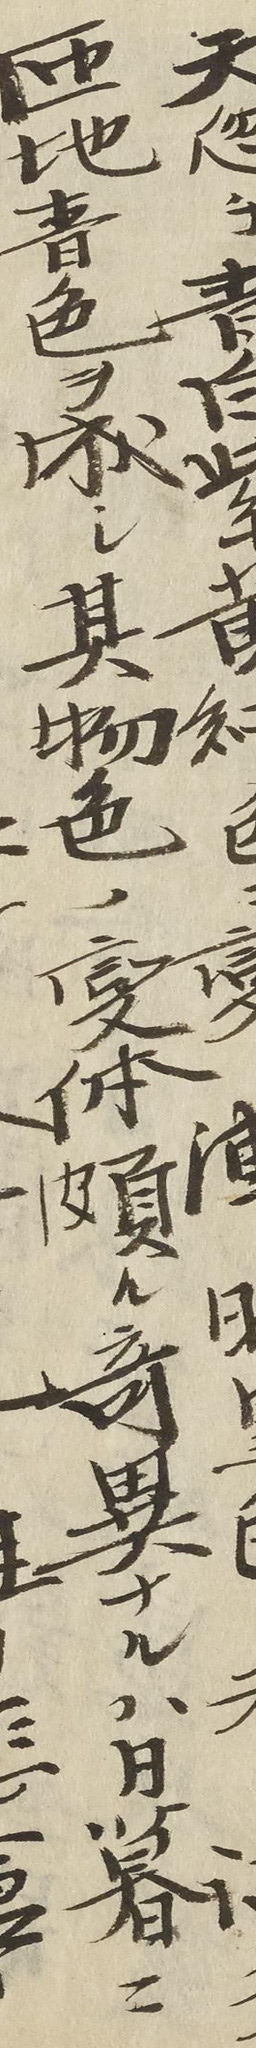匝地青色ヲ成シ其物色ノ変体頗ル奇異ナルハ日暮ニ
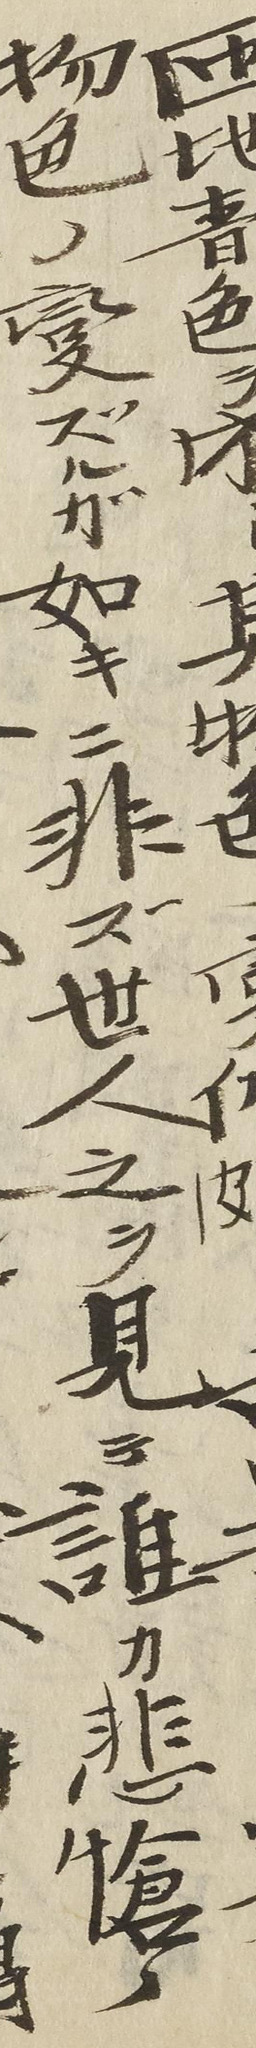物色ノ変ズルガ如キニ非ズ世人之ヲ見テ誰カ悲愴ノ
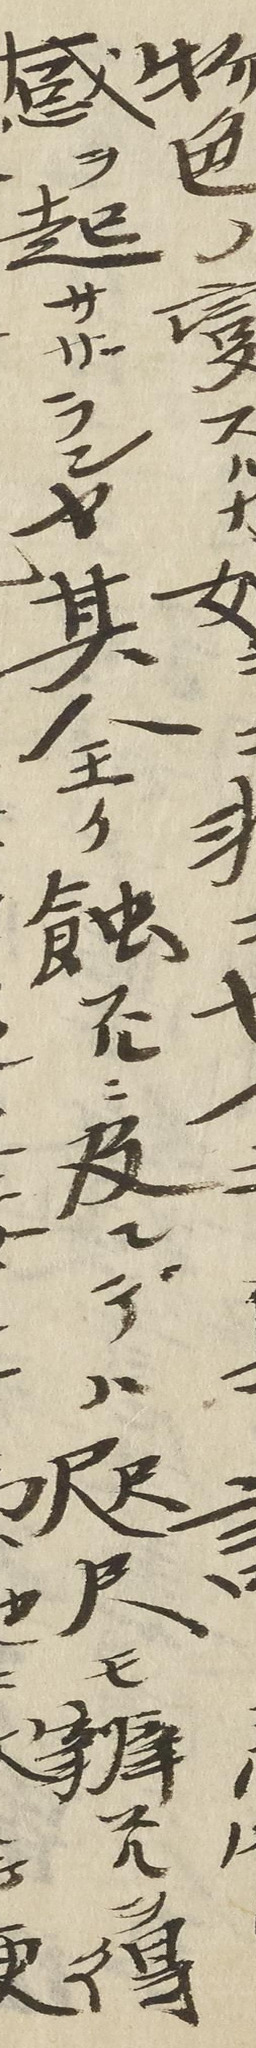感ヲ起サザランヤ其全ク蝕スルニ及ンデハ咫尺モ弁スルヲ得
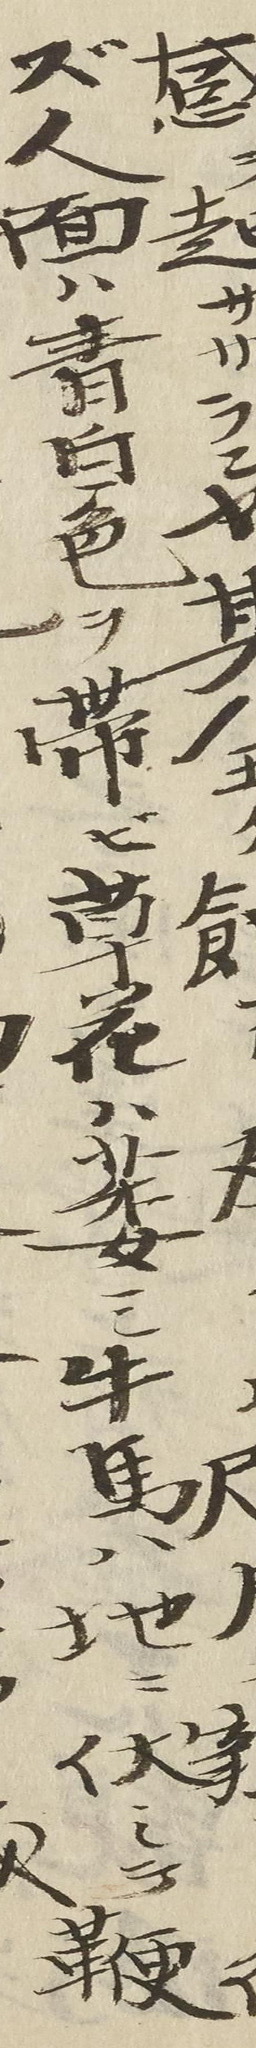ズ人面ハ青白色ヲ帯ビ草花ハ萎シ牛馬ハ地ニ伏シテ鞭
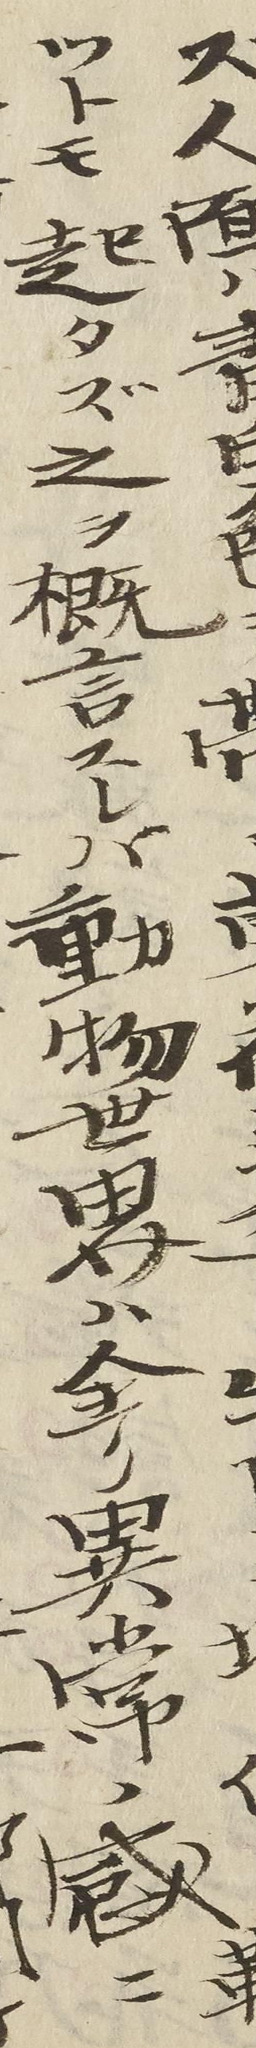ツトモ起タズ之ヲ概言スレバ動物世界ハ全ク異常ノ感ニ
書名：日蝕録　全
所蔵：東京大学地震研究所図書室 Earthquake Research Institute Library, The University of Tokyo, JAPAN
